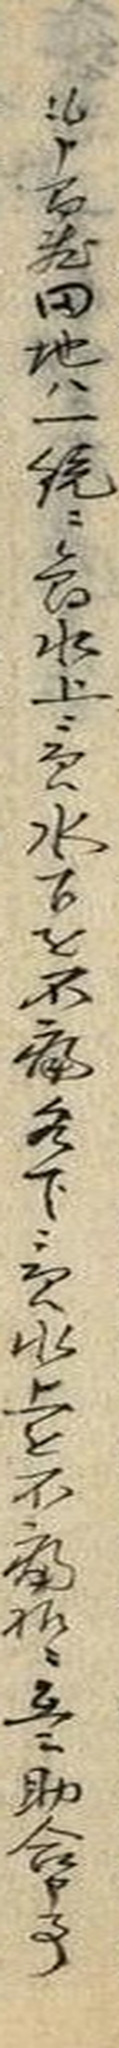も申間敷田地ハ一統ニ候間水上ニ而ハ水下を不痛水下ニ而ハ水上を不痛様ニ互ニ助合申事
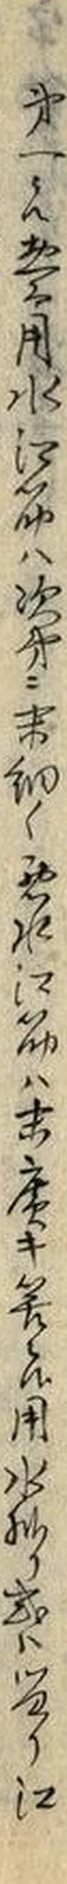第一ニ候惣而用水江筋ハ次第ニ末細く悪水江筋ハ末広キ筈ニ候用水掛り或ハ留り江
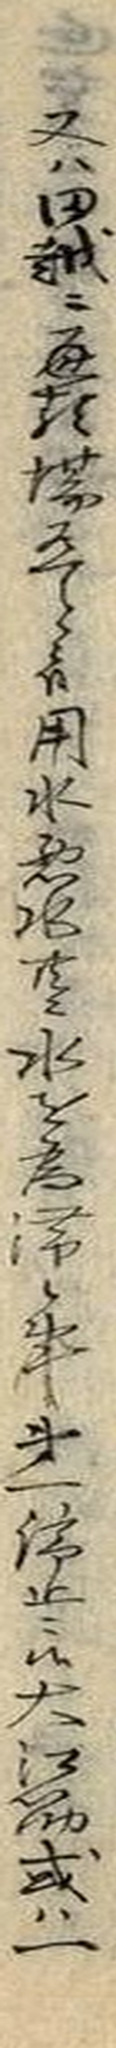又ハ田越ニ通類場有之候ニ付用水悪水共ニ水を為滞候事第一停止ニ候大江筋或ハ一
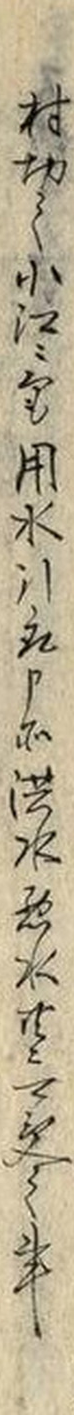村切之小江ニ而も用水引取申所洪水悪水共ニ可受之事
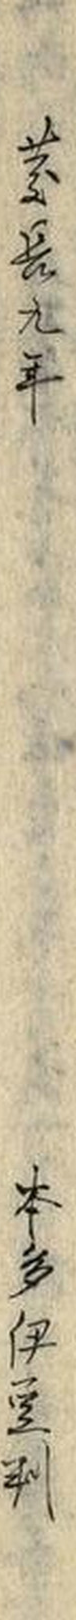慶長九年本多伊豆判
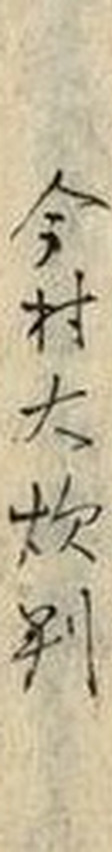今村大炊判
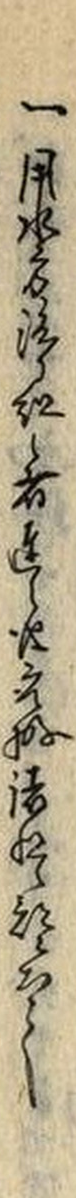一用水方渡り組之者達之儀取扱諸組之部ニ出之
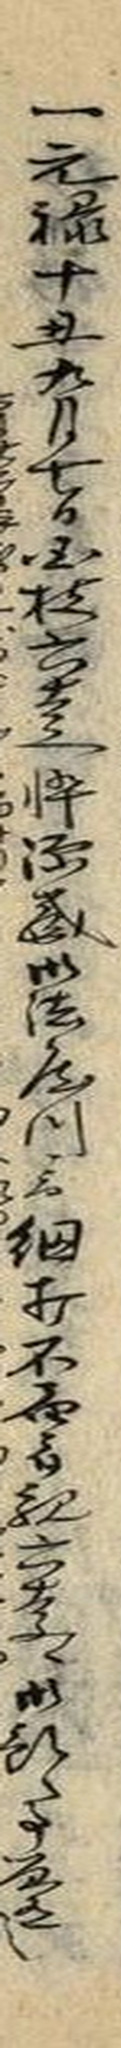一元禄十丑九月七日国枝六太夫忰源蔵御法度川ニ而網打不届ニ付親六太夫へ御預候事留有

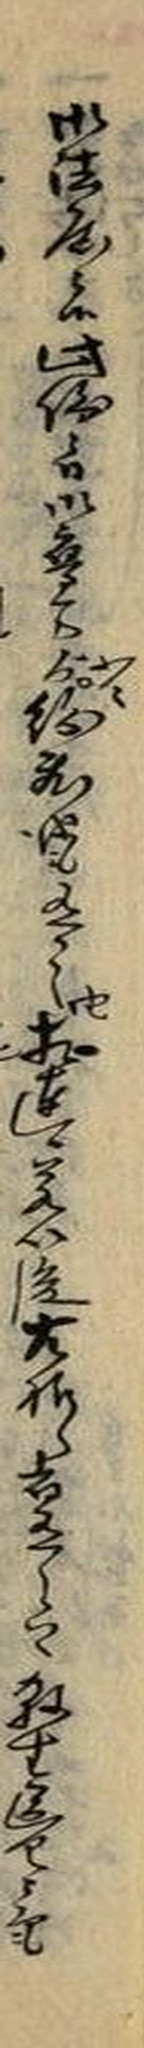御法度ニ候此儀ニ付御鷹方ゟ少々紛敷儀も有之由相達候若以後左様之者有之候ハヽ殺生道具ニ而も
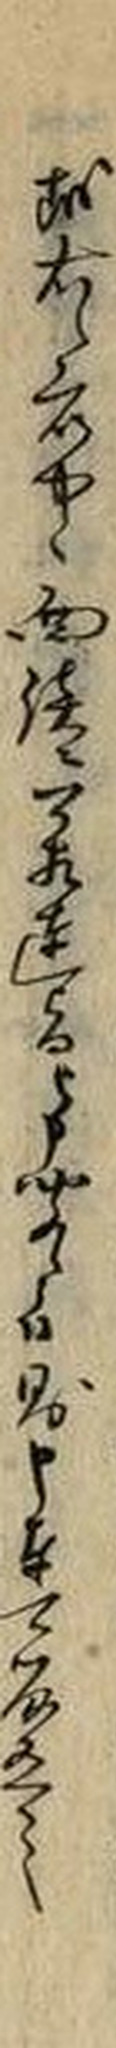越右之者中へ面談ニ可相達旨被申聞候ニ付則申達候留有之
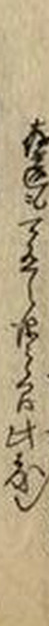存違も可有之儀ニ候間此也
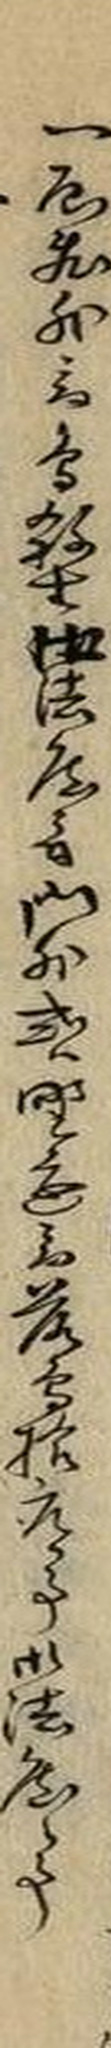一屋敷外ニ而鳥殺生御法度ニ付門外或ハ野辺ニ而落鳥拾取候事御法度候事
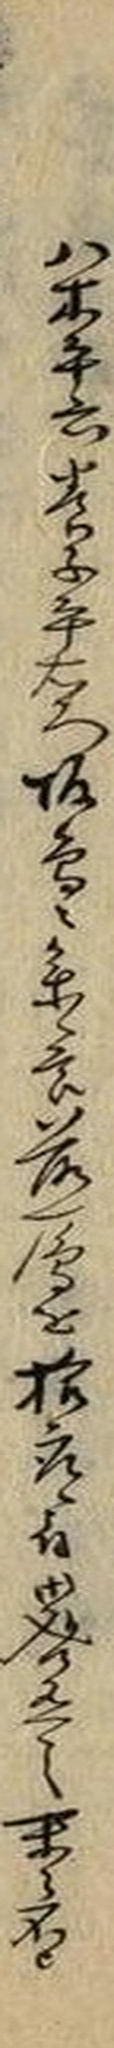一八木平六養子平右衛門坂鳥ニ参候節落鳫を拾取候ニ付御咎有之末々不被
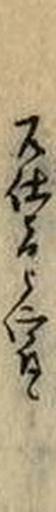召仕旨被仰付候
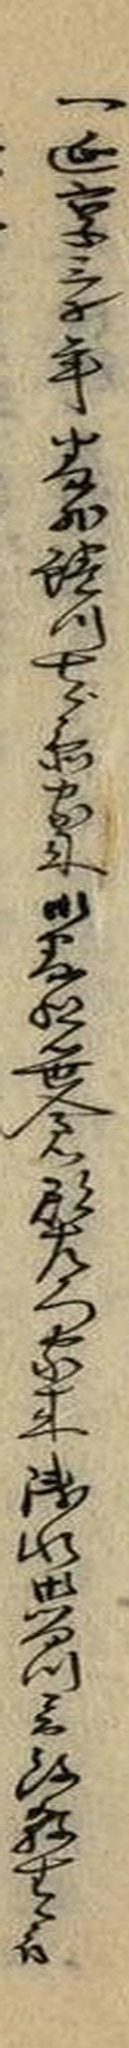一延享三寅年番外蜷川七郎兵衛家来御番組笹倉郡左衛門家来浅水御留川ニ而致殺生候ニ付
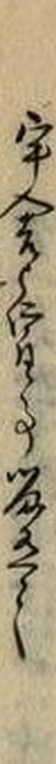牢舎被仰付候事留有之
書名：御国他国諸事之部
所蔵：福井県文書館 Fukui Prefectural Archives
